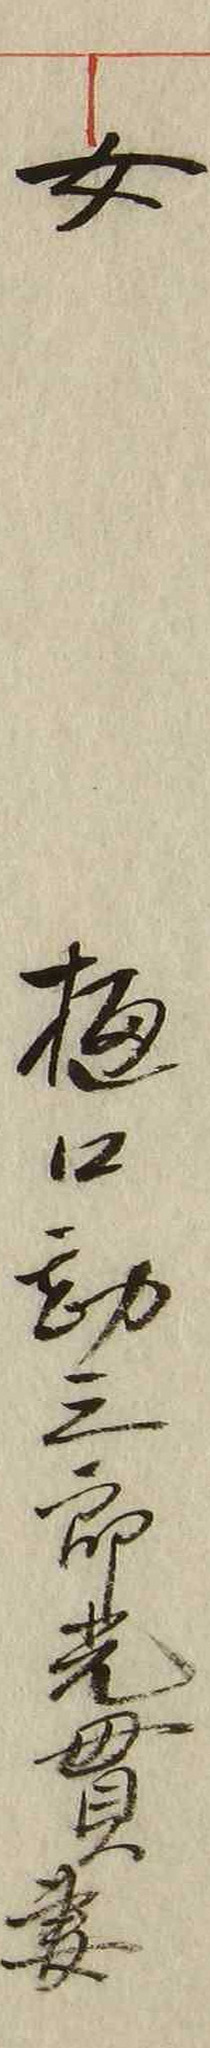女樋口勘三郎光貫妻
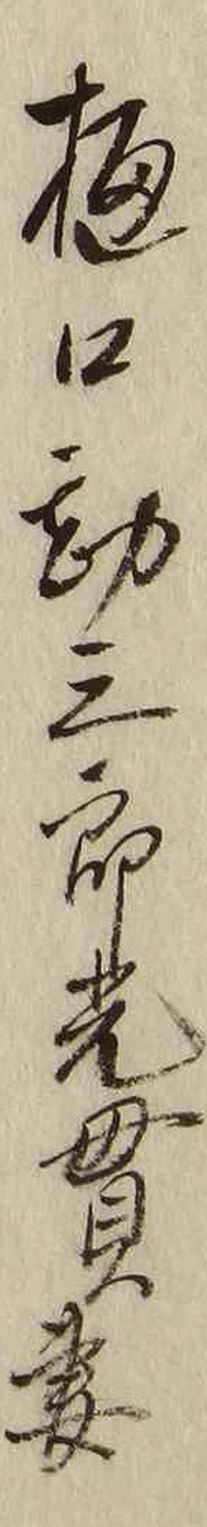女樋口勘三郎光貫妻
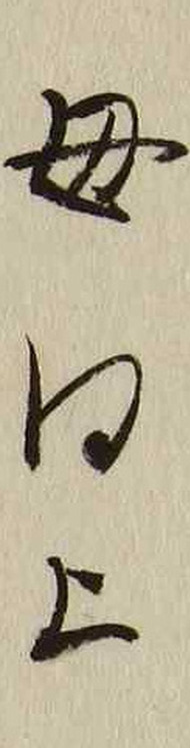母同上
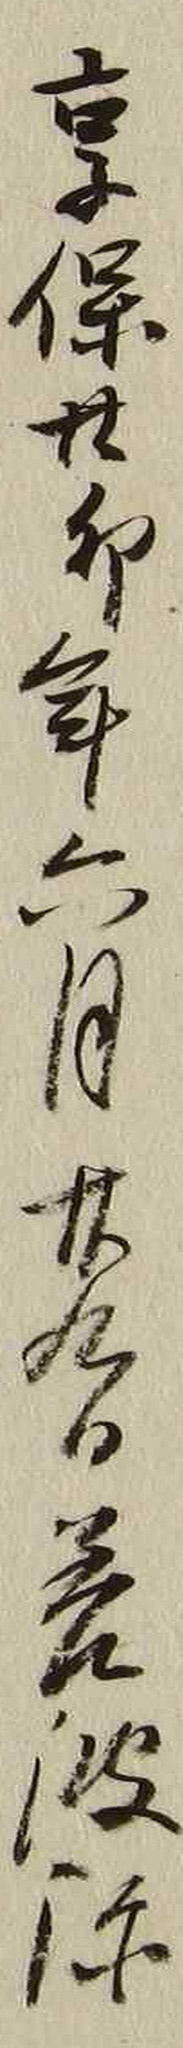享保廿卯年六月廿九日善波弥
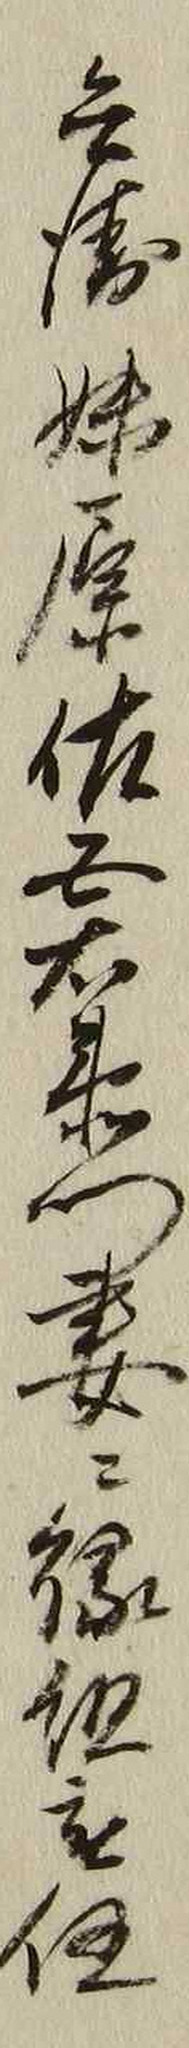兵衛妹原佐五右衛門妻縁組被任
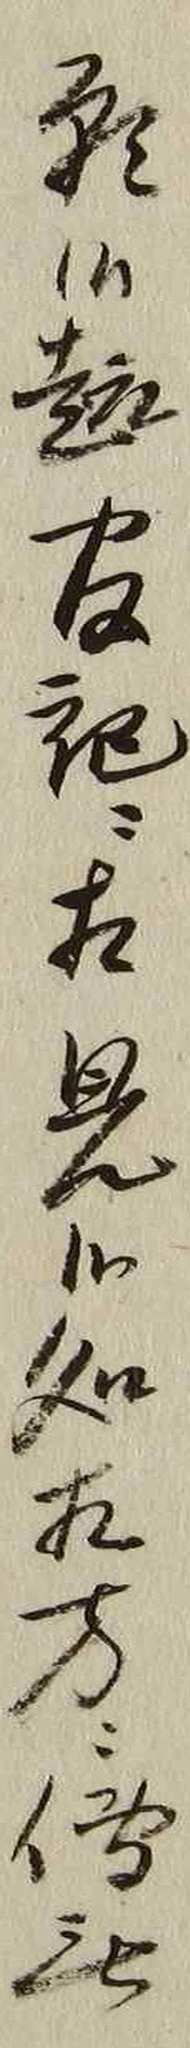願候趣官記相見候処相方伝無
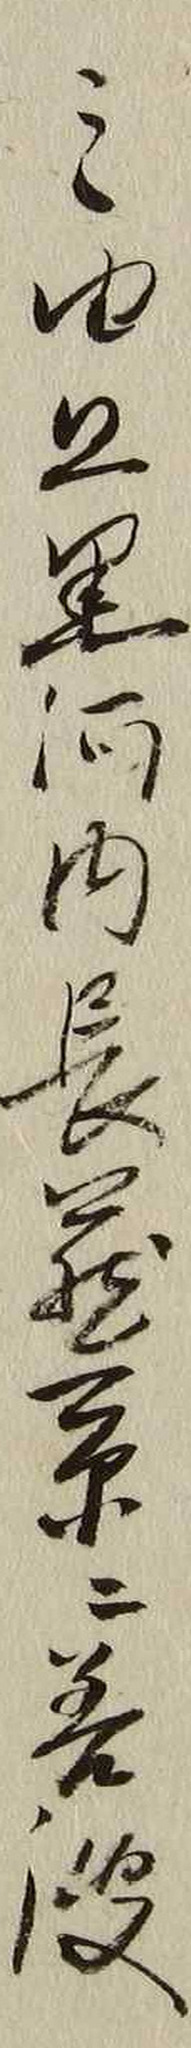之由且黒河内長蔵系善波
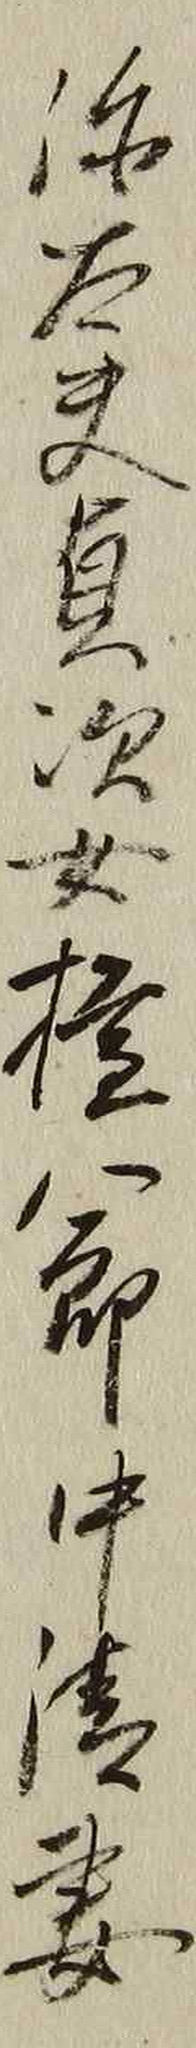弥太夫貞次女権八郎中清妻
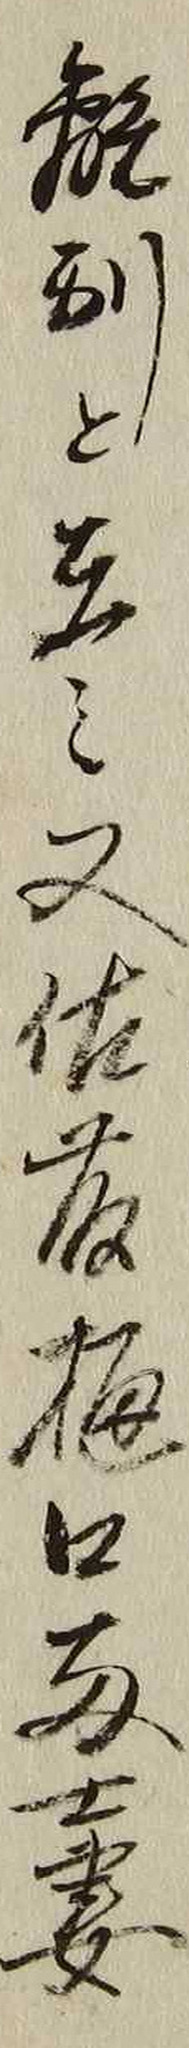離別と在之又佐藤樋口両士妻
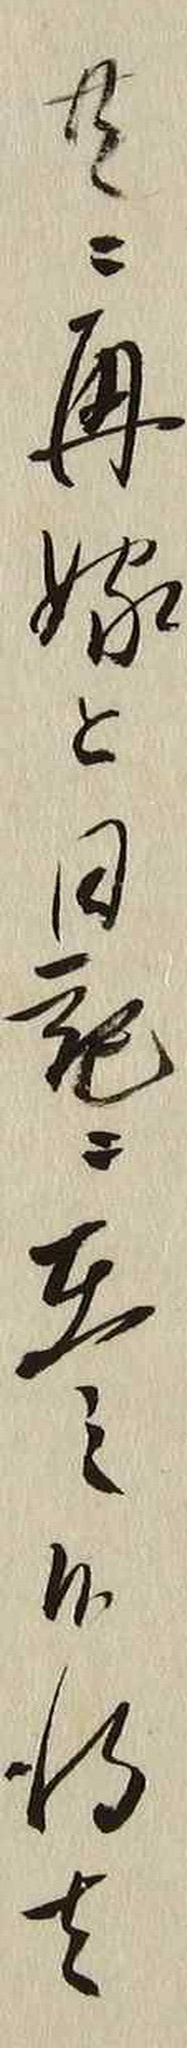共再嫁と日記在之候得者
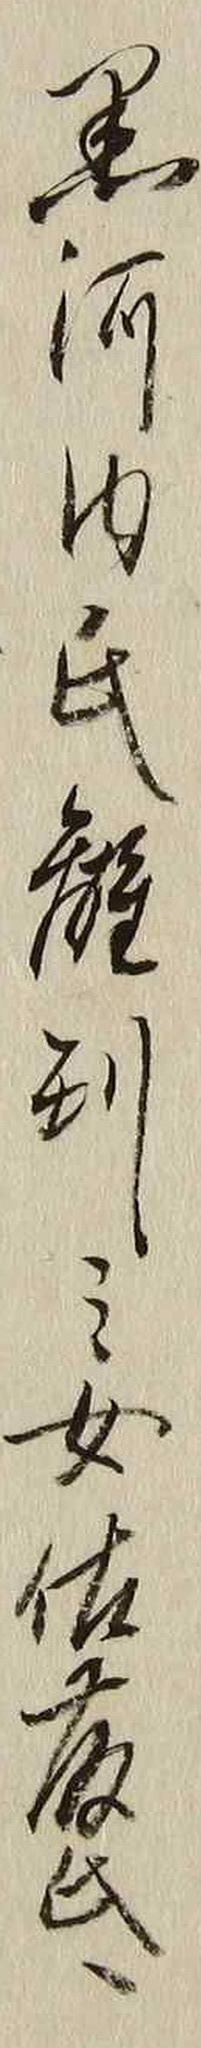黒河内氏離別之女佐藤氏
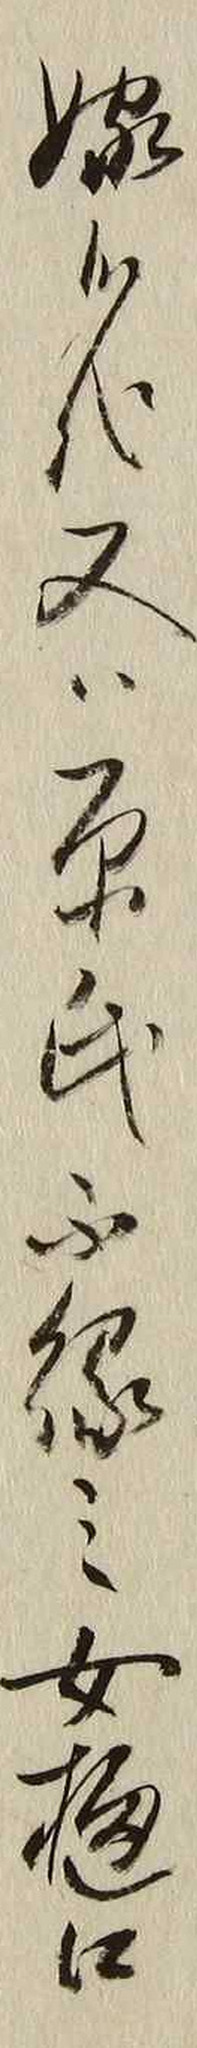嫁候哉又ハ原氏不縁之女樋口
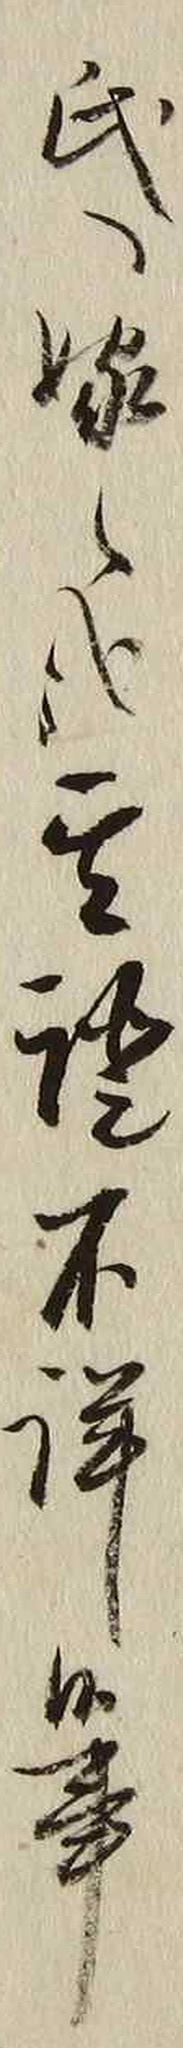氏嫁候哉其証不詳候事
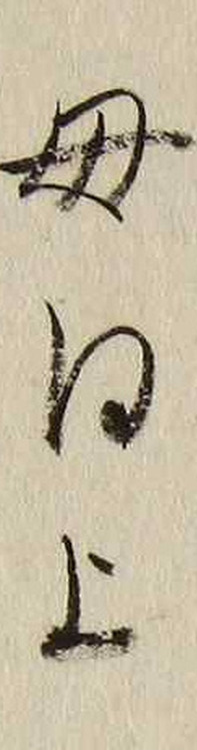母同上

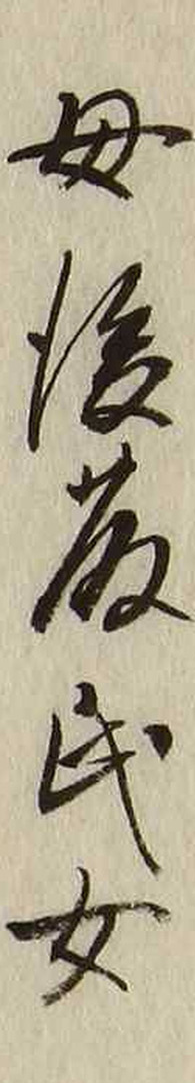母後藤氏女
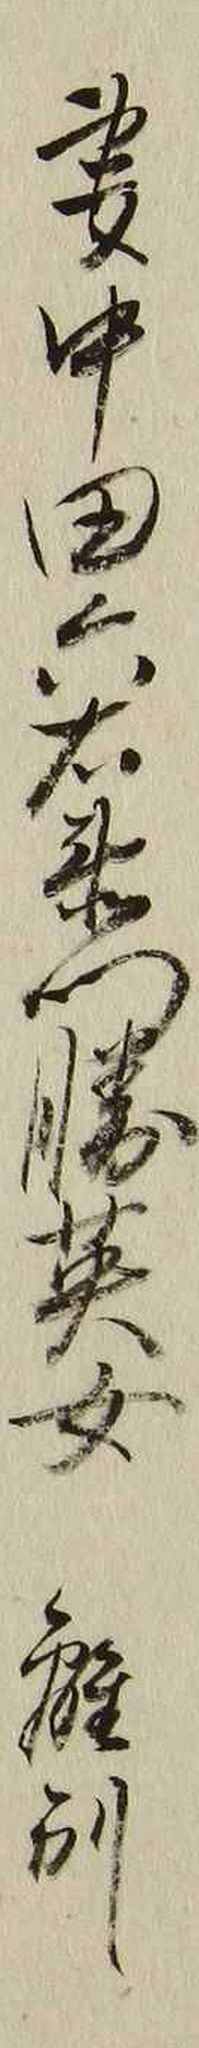妻中田六右衛門勝英女離別
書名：諸士系譜　巻之350　せ之部1冊全
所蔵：会津若松市立会津図書館
